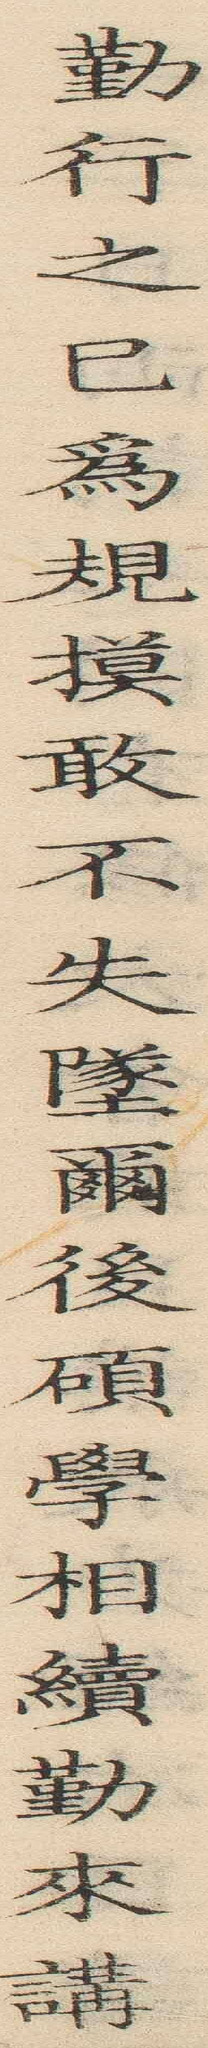勤行之巳爲規摸敢不失墜爾後碩學相續勤求講
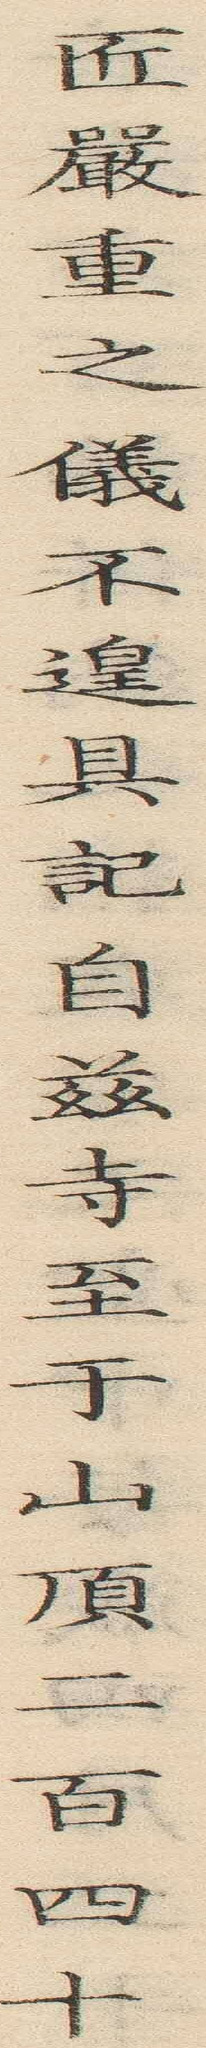匠嚴重之儀不遑具記自兹寺至于山頂二百四十
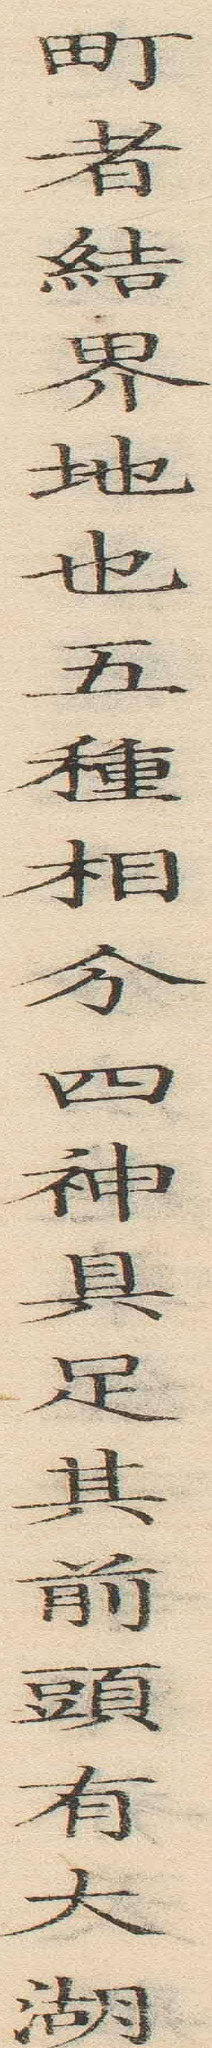町者結界地也五種相分四神具足其前頭有大湖
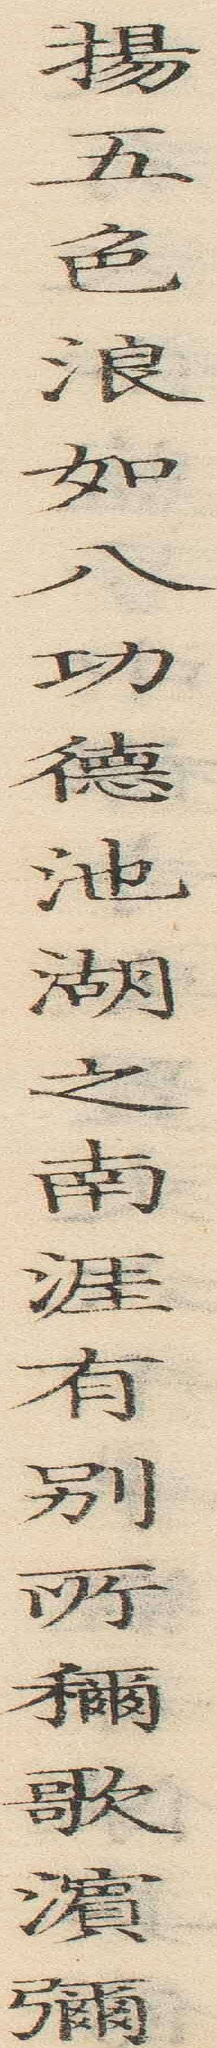揚五色浪如八功德池湖之南涯有別所穪歌濵彌
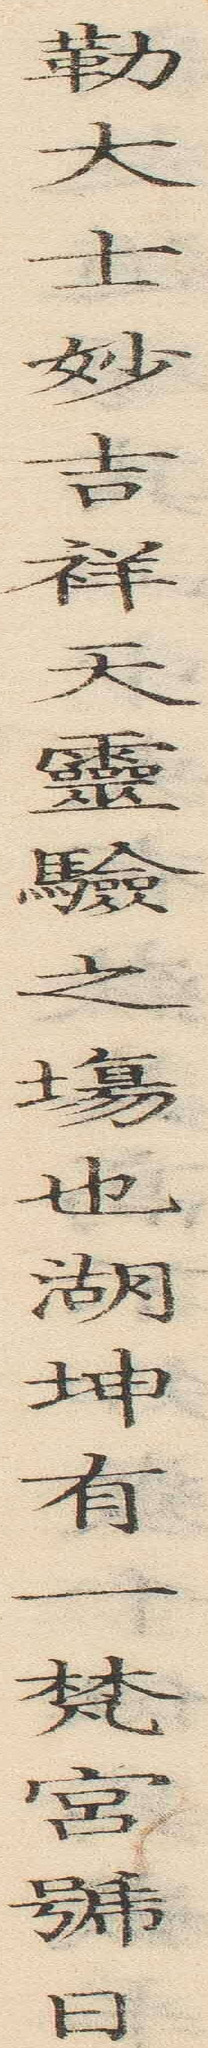勒大士妙吉祥天靈驗之塲也湖坤有一梵宮號日
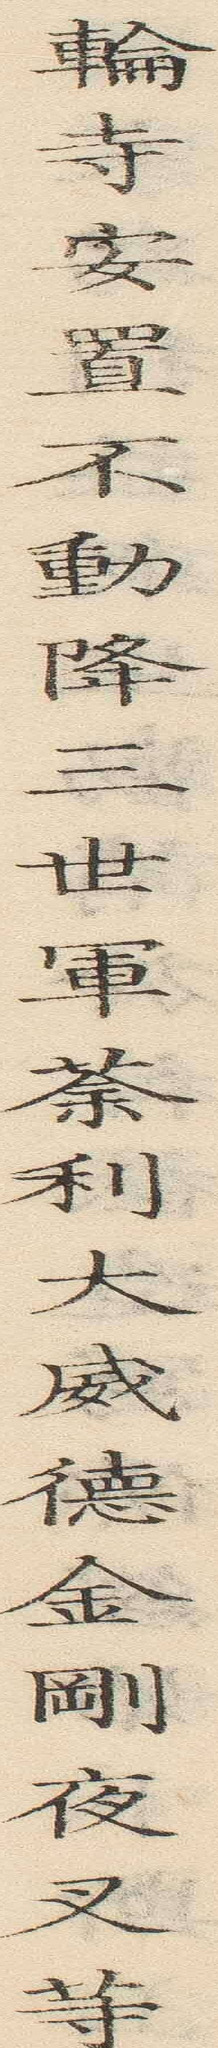輪寺安置不動降三世軍荼利大威德金剛夜叉等
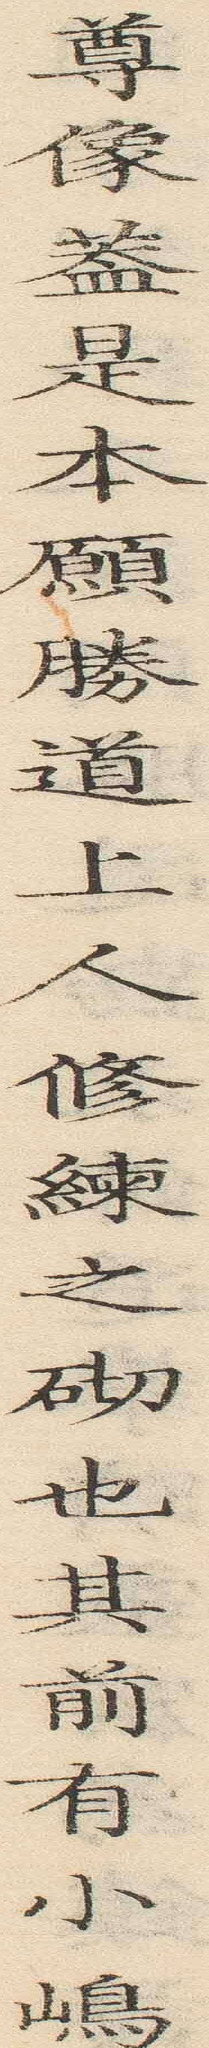尊像葢是本願勝道上人修練之砌也其前有小嶋
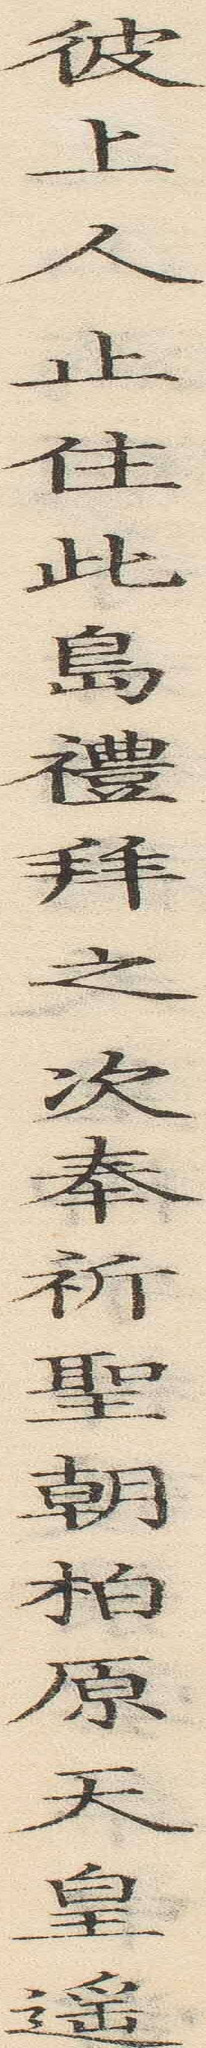彼上人止住此島禮拜之次奉祈聖朝柏原天皇遥
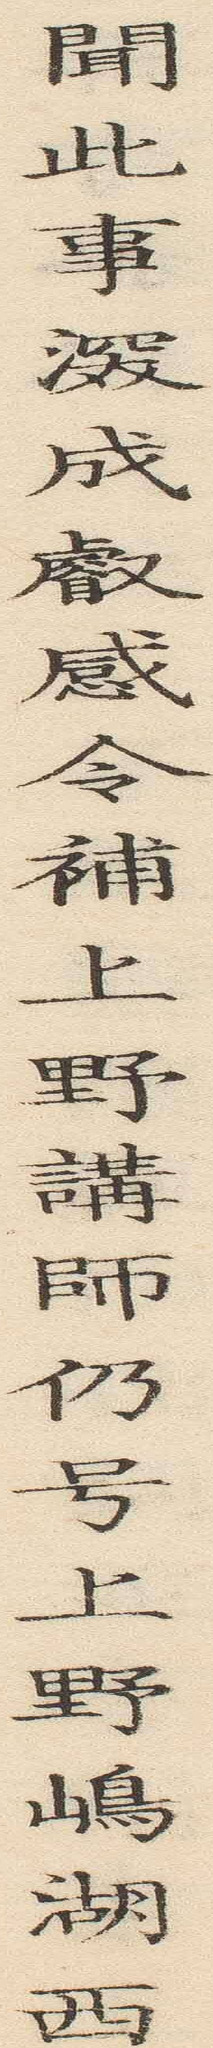聞此事㴱成叡感令補上野講師仍号上野嶋湖西
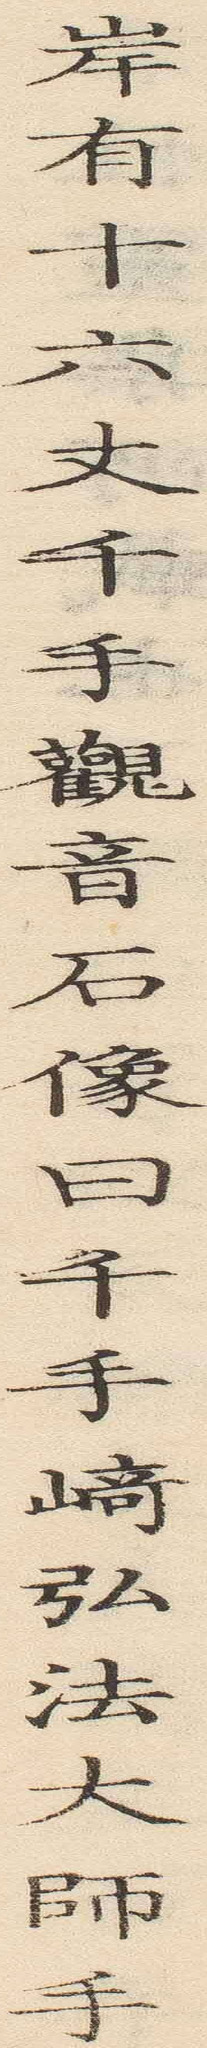岸有十六丈千手觀音石像曰千手﨑弘法大師手
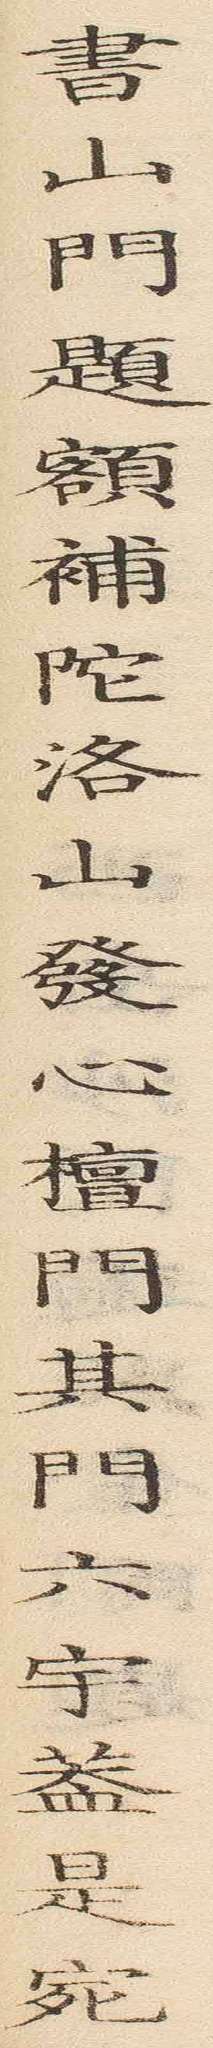書山門題額補陀洛山發心檀門其門六宇葢是宛
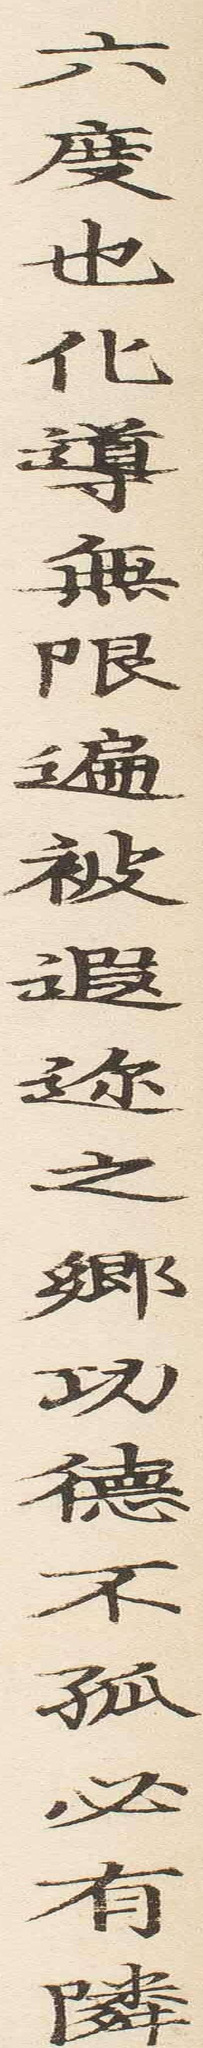六度也化導無限遍被遐迩之郷功德不孤必有隣
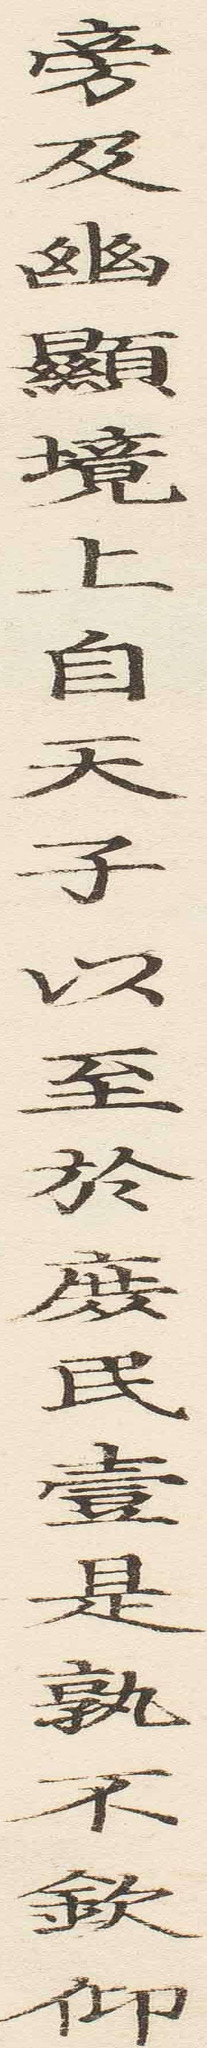旁及幽顯境上自天子以至於庻民壹是孰不欽仰
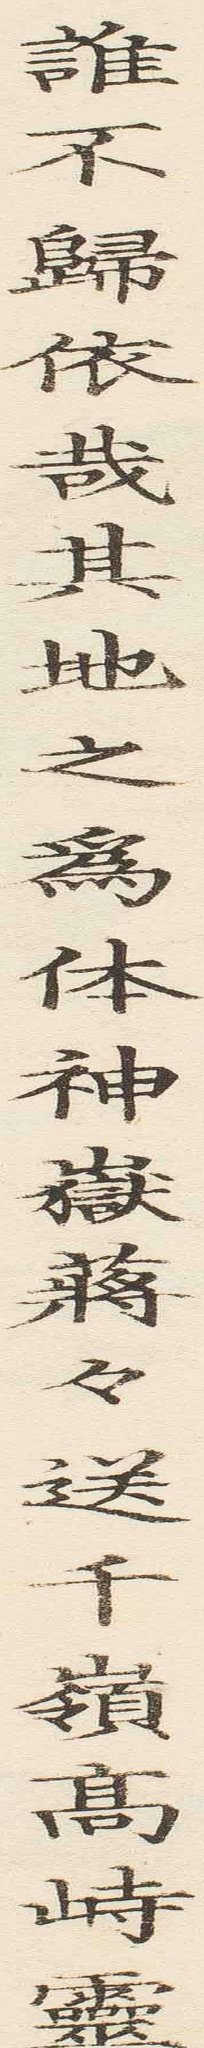誰不歸依哉其地之爲体神嶽蔣々送千嶺髙峙靈
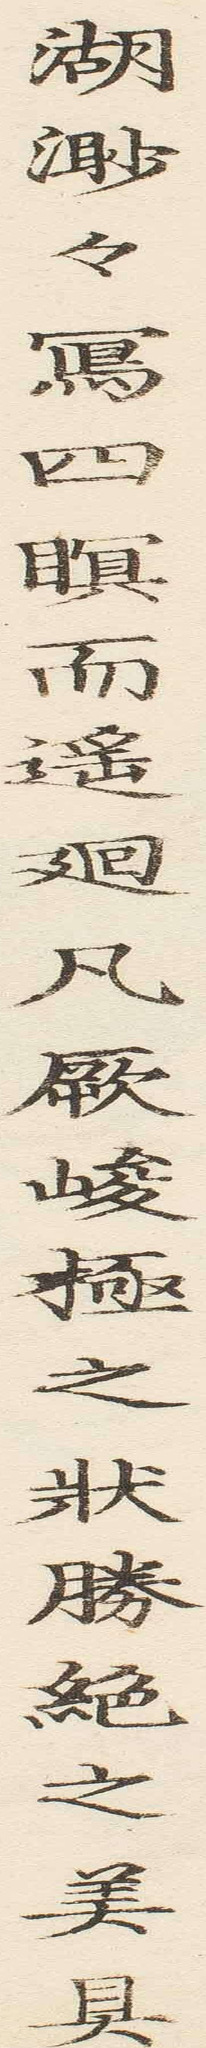湖渺々冩四瞑而遥𢌞凡厥峻極之狀勝絶之美具
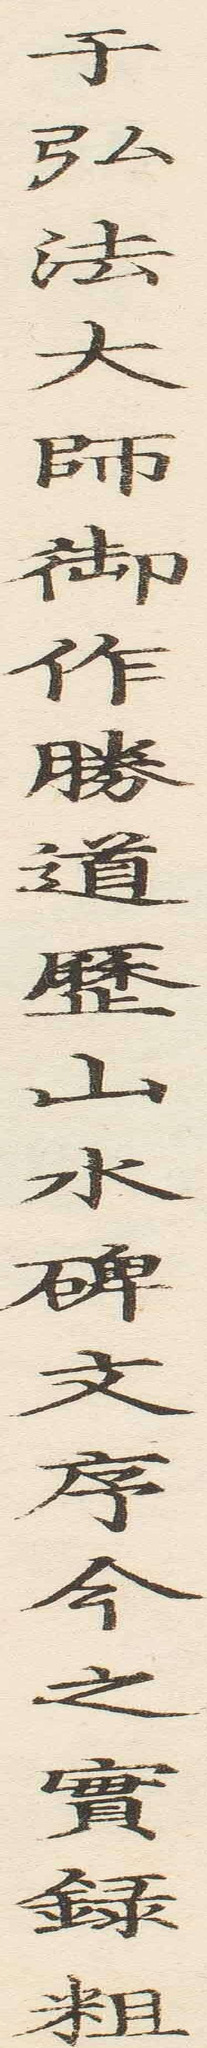于弘法大師御作勝道歷山水碑文序今之實録粗
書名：日光山志
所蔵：東京学芸大学附属図書館 国文学研究資料館
